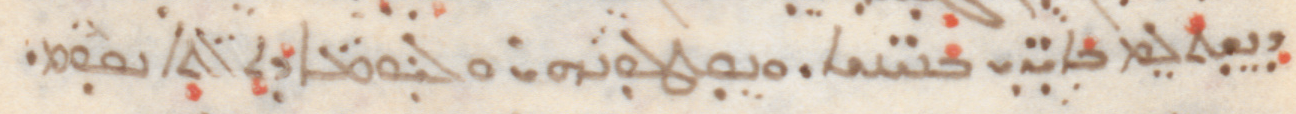ܕܢܫܬܠܡ ܒܐܝ̈ܕܝ ܒܢܝ̈ܢܫܐ. ܘܢܩܛܠܘܢܗܝ ܘܠܝܘܡܐ ܕܬܠܬܐ ܢܩܘܡ.
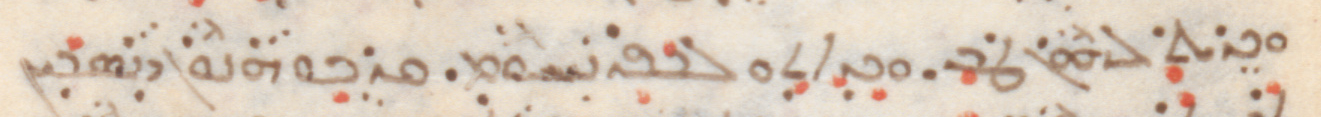ܘܟܪܝܬ ܠܗܘܢ ܛܒ. ܘܟܕ ܐܬܘ ܠܟܦܪܢܚܘܡ. ܩܪܒܘ ܗܢܘܢ ܕܢ̇ܣܒܝܢ
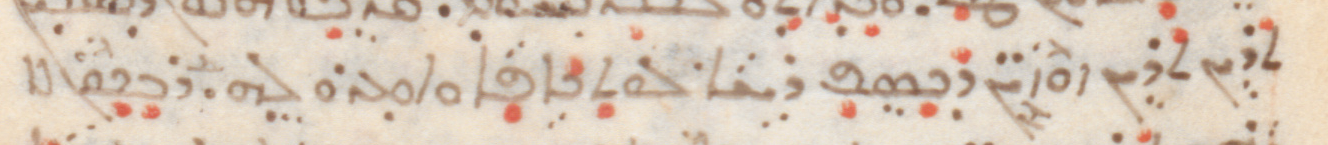ܬܪܝܢ ܬܪܝܢ ܙܘܙ̈ܝܢ ܕܟܣܦ ܪܝܫܐ ܠܘܬ ܟܐܦܐ ܘܐܡܪܘ ܠܗ. ܪܒܟܘܢ ܠܐ
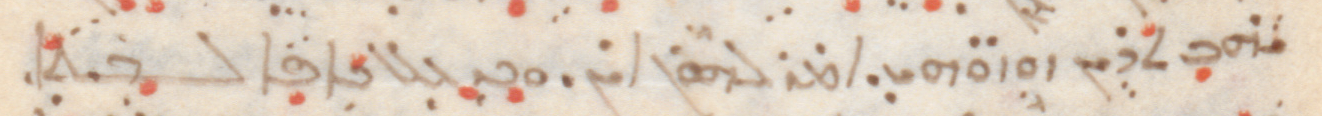ܝ̇ܗܒ ܬܪܝܢ ܙܘܙ̈ܘܗܝ܆ ܐܡ̇ܪ ܠܗܘܢ ܐܝܢ. ܘܟܕ ܥܠ ܟܐܦܐ ܠܒܝܬܐ.
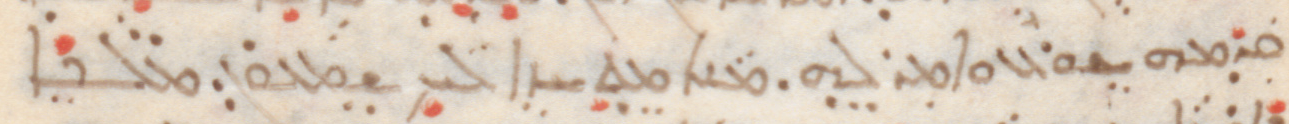ܩܕܡܗ ܝܫܘܥ ܘܐܡ̇ܪ ܠܗ. ܡܢܐ ܡܬܚܙܐ ܠܝ ܫܡܥܘܢ܆ ܡ̈ܠܟܐ
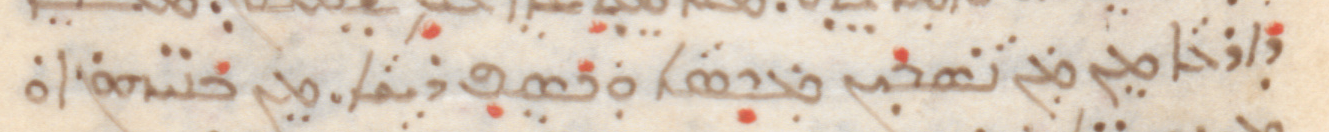ܕܐܪܥܐ ܡܢ ܡ̇ܢ ܢܣܒܝܢ ܡܟܣܐ ܘܟܣܦ ܪܝܫܐ. ܡܢ ܒܢܝ̈ܗܘܢ ܐܘ
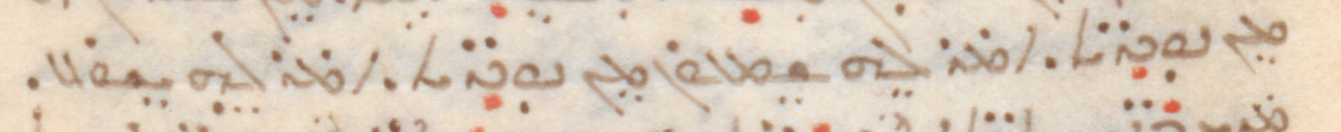ܡܢ ܢܘܟܪ̈ܝܐ. ܐܡ̇ܪ ܠܗ ܫܡܥܘܢ ܡܢ ܢܘܟܪ̈ܝܐ. ܐܡ̇ܪ ܠܗ ܝܫܘܥ.
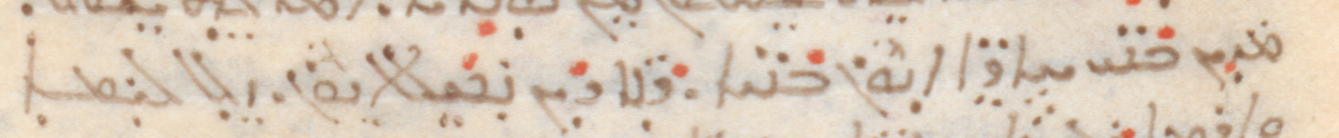ܡܕܝܢ ܒܢ̈ܝ ܚܐܪ̈ܐ ܐܢܘܢ ܒܢ̈ܝܐ: ܕܠܐ ܕܝܢ ܢܟܫܠ ܐܢܘܢ. ܙܠ̣ ܠܝܡܐ
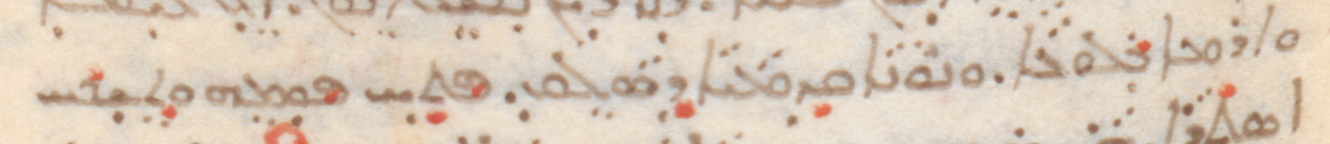ܘܐܪܡܐ ܒܠܘܥܐ. ܘܢܘܢܐ ܩܕܡܝܐ ܕܣܠܩ܆ ܦܬܚ ܦܘܡܗ ܘܬܫܟܚ
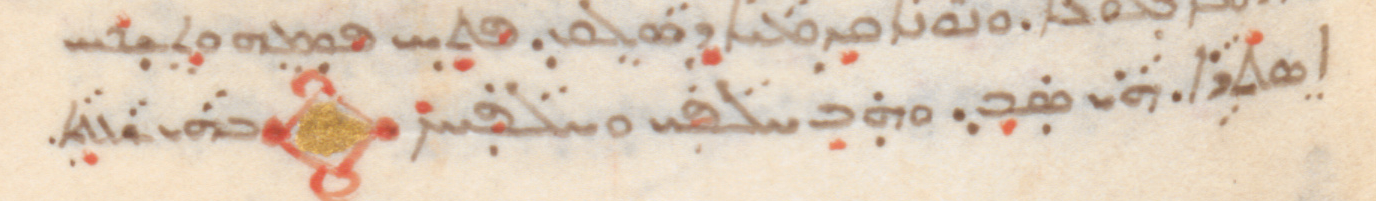ܐܤܬܪܐ. ܗ̇ܝ ܣܒ܆ ܘܗܒ ܚܠܦܝ ܘܚܠܦܝܟ ܀ ܒܗܝ ܫܥܬܐ
